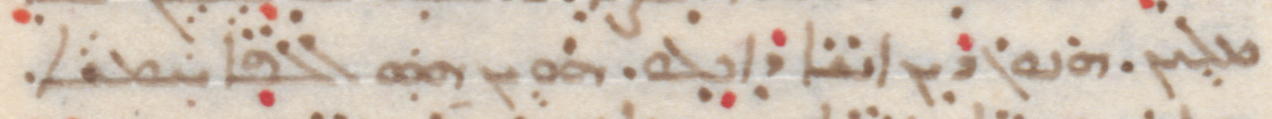ܡܠܝܢ. ܗܢܘܢ ܕܝܢ ܐܢܫܐ ܕܐܟܠܘ. ܗ̇ܘܝܢ ܗܘܘ ܐܠܦ̈ܐ ܚܡܫܐ.
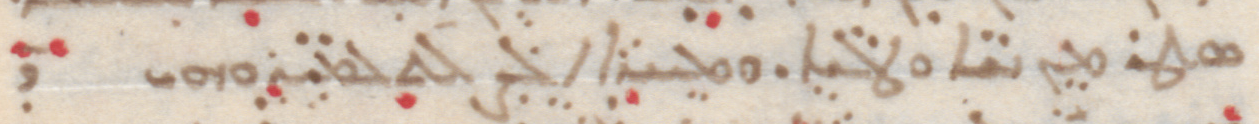ܣܛܪ ܡܢ ܢܫ̈ܐ ܘܛܠ̈ܝܐ. ܘܡܚܕܐ ܐܠܨ ܠܬܠܡܝ̈ܕܘܗܝ ܏ܕ
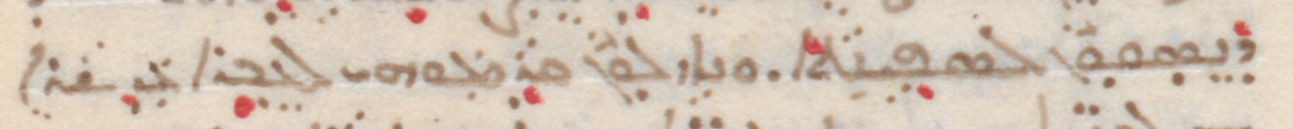ܕܢܣܩܘܢ ܠܣܦܝܢܬܐ. ܘܢܐܙܠܘܢ ܩܕܡܘܗܝ ܠܥܒܪܐ ܥܕ ܫܪܐ
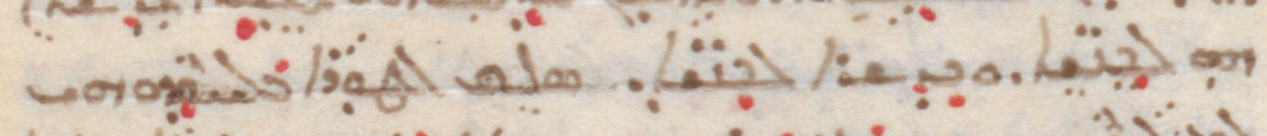ܗ̣ܘ ܠܟܢ̈ܫܐ. ܘܟܕ ܫܪܐ ܠܟܢ̈ܫܐ. ܣܠܩ ܠܛܘܪܐ ܒܠܚܘܕܗܝ
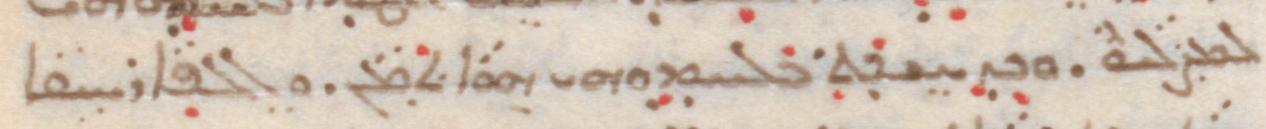ܠܡܨܠܝܘ. ܘܟܕ ܚܫܟܬ ܒܠܚܘܕܘܗܝ ܗܘܐ ܬܡܢ. ܘܐܠܦܐ ܪܚܝܩܐ
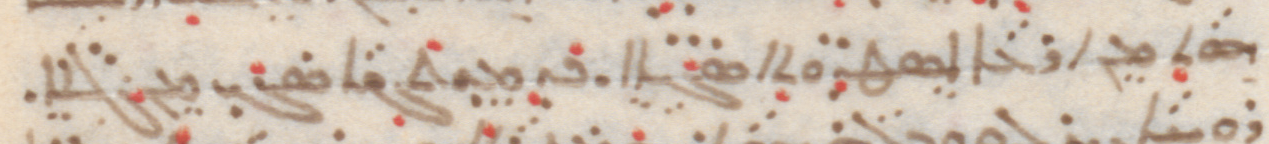ܗܘܬ ܡܢ ܐܪܥܐ ܐܣܛܕ̈ܘܬܐ ܣܓ̈ܝܐܐ. ܟܕ ܡܫܬܓܫܐ ܣܓܝ ܡܢ ܓܠ̈ܠܐ.
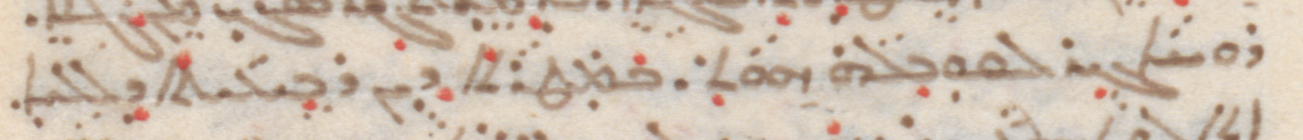ܪܘܚܐܓܝܪ ܠܩܘܒܠܗ̇ ܗܘܬ. ܒܡܛܪܬܐ ܕܝܢ ܪܒܝܥܝܬܐ ܕܠܠܝܐ.
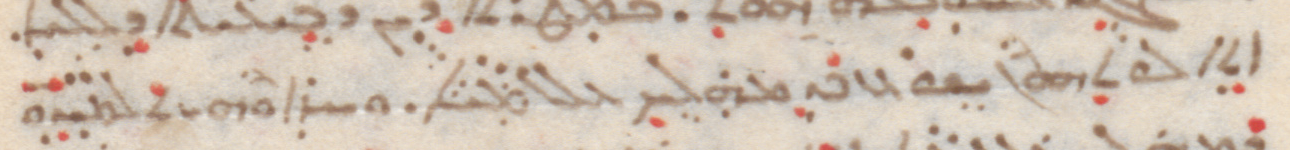ܐܬ̣ܐ ܠܘܬܗܘܢ ܝܫܘܥ ܟܕ ܡܗܠܟ ܥܠ ܡ̈ܝܐ. ܘܚܙܐܘܗܝ ܬܠܡܝ̈ܕ܏ܘ
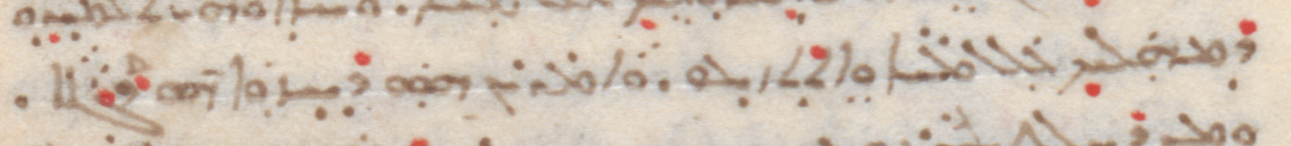ܕܡܗܠܝܟ ܥܠ ܡܝ̈ܐ ܘܐܬܬܙܝܥܘ. ܘܐܡ̇ܪܝܢ ܗܘܘ ܕܚܙܘܐ ܗܘ ܕܓܠܐ.
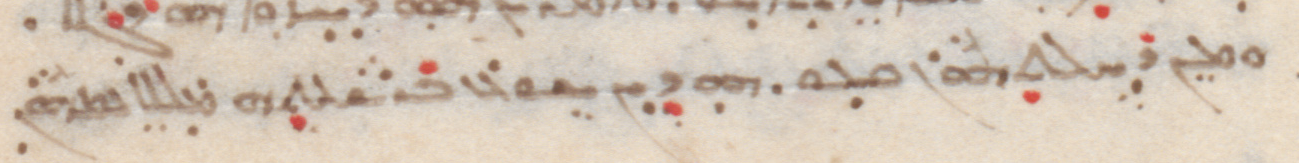ܘܡܢ ܕܚܠܬܗܘܢ ܩܥ̣ܘ. ܗ̣ܘ ܕܝܢ ܝܫܘܥ ܒܪܫܥܬܗ ܡܠܠܐ ܥܡܗܘܢ
